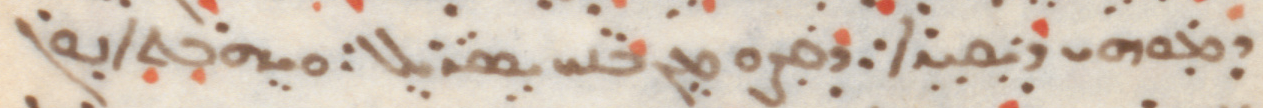ܕܡܘܗܝ ܕܝܩܝܪܐ: ܕܩܨܘ ܡܢ ܒܢ̈ܝ ܝܣܪܝܠ: ܘܝܗܒܬ ܐܢܘܢ
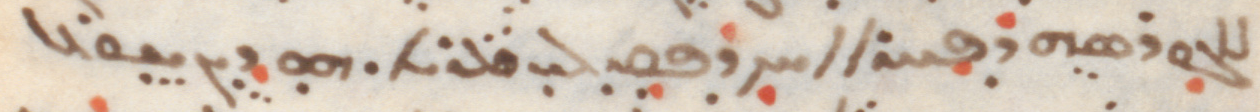ܠܐܓܘܪܣܗ ܕܦܚܪܐ ܐܝܟ ܕܦܩܕ ܠܝ ܡܪܝܐ. ܗ̣ܘ ܕܝܢ ܝܫܘܥ
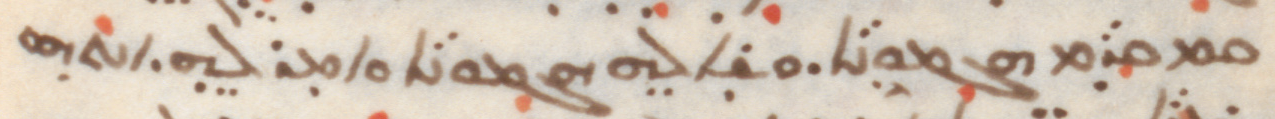ܩܡ ܩܪܡ ܗܓܡܘܢܐ. ܘܫܐܠܗ ܗܝܓܡܘܢܐ ܘܐܡ̣ܪ ܠܗ. ܐܢܬ ܗܘ
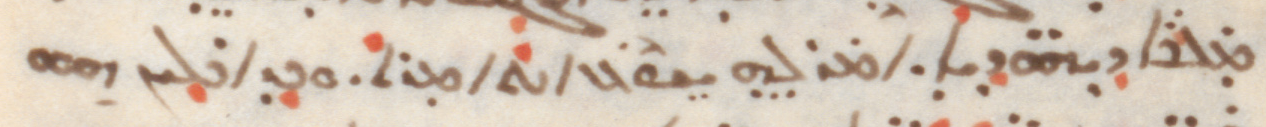ܡܠܟܐ ܕܝܗ̈ܘܕܝܐ. ܐܡ̇ܪ ܠܗ ܝܫܘܥ ܐܢܬ ܐܡܪܬ. ܘܟܕ ܐܟ̇ܠܝܢ ܗܘܘ
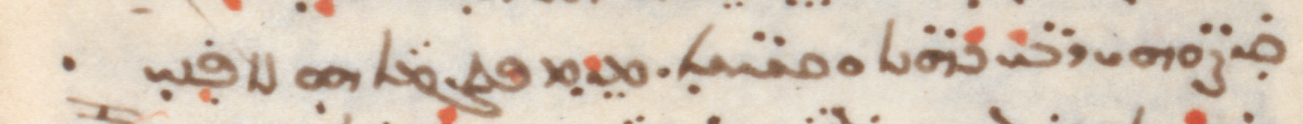ܩܪ̈ܨܘܗܝ ܪ̈ܒܝ ܟܗ̈ܢܐ ܘܩܫ̈ܝܫܐ. ܡܕܡ ܦܬܓܡܐ ܗ̣ܘ ܠܐ ܦܢܝ .
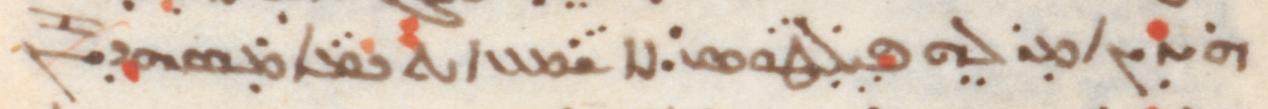ܗܝܕܝܢ ܐܡ̣ܪ ܠܗ ܦܝܠܛܘܣ: ܠܐ ܫ̇ܡܥ ܐܢܬ ܟܡܐ ܡܣܗܕܝܢ
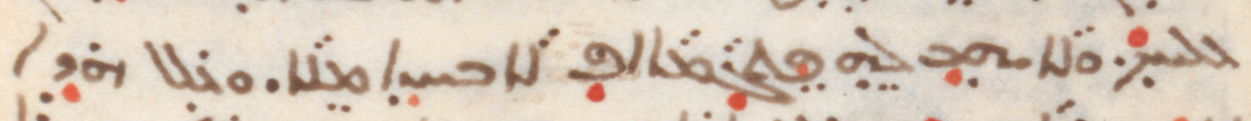ܥܠܝܟ. ܘܠܐ ܝܗ̣ܒ ܠܗ ܦܬܓܡܐ ܐܦ ܠܐ ܒܚܕܐ ܡܠܐ. ܘܥܠ ܗܕܐ
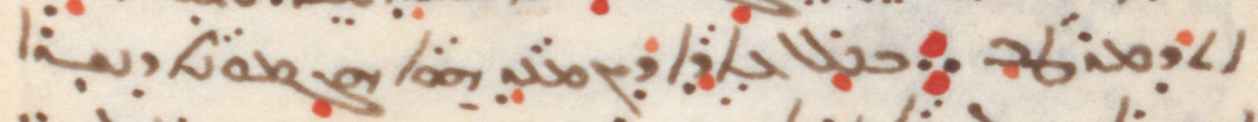ܐܬܕܡܪ ܛܒ܀ ܒܟܠ ܥܐܕܐ ܕܝܢ ܡܥܕ ܗܘܐ ܗܓܡܘ̈ܢܐ ܕܢܫܪܐ
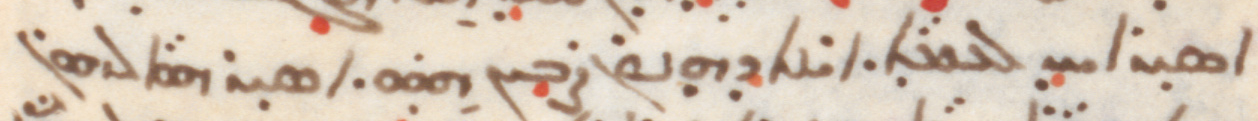ܐܣܝܪܐ ܚܕ ܠܥܡܐ܆ ܐܝܢܐ ܕܗܢܘܢ ܨ̇ܒܝܢ ܗܘܘ. ܐܣܝܪ ܗܘܐ ܠܗܘܢ
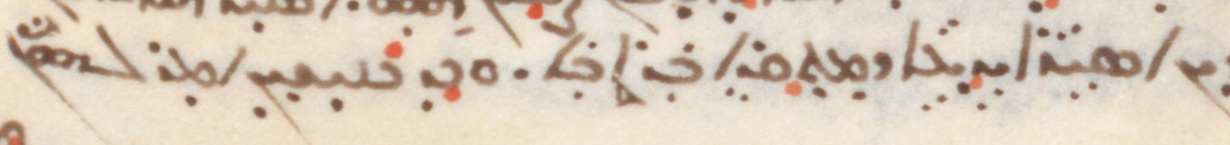ܕܝܢ ܐܣܝܪ̈ܐ ܝܕܥܐ ܕܡܬܩܪܐ ܒܪ ܐܒܐ. ܘܟܕ ܟܢܝܫܝܢ ܐܡ̣ܪ ܠܗܘܢ
